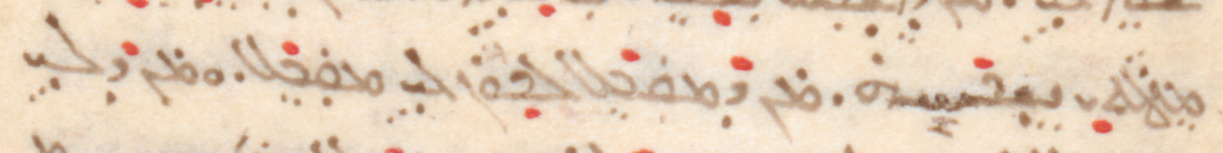ܡܛܠܬܝ ܢܫܟܝܚܗ̇. ܡ̇ܢ ܕܡܩܒܠ ܠܟܘܢ ܠܝ ܡܩܒܠ. ܘܡ̇ܢ ܕܠܝ
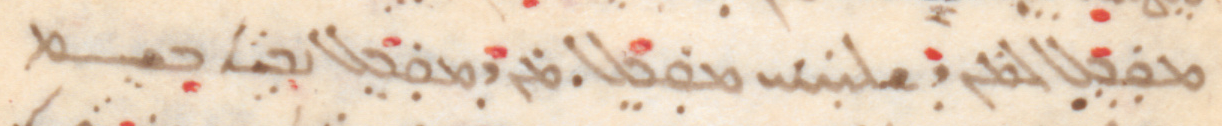ܡܩܒܠ ܠܡ̇ܢ ܕܫܠܚܢܝ ܡܩܒܠ. ܡ̇ܢ ܕܡܩܒܠ ܢܒܝܐ ܒܫܡ
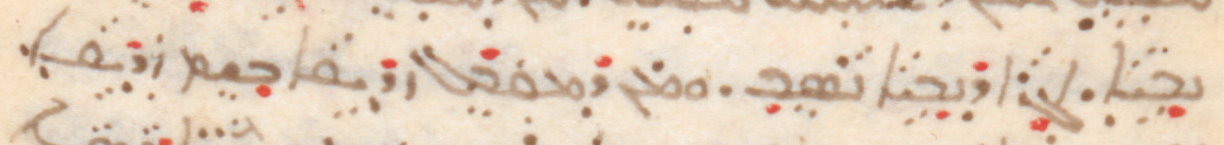ܢܒܝܐ. ܐܓܪܐ ܕܢܒܝܐ ܢ̇ܣܒ. ܘܡ̇ܢ ܕܡܩܒܠ ܙܕܝܩܐ ܒܫܡ ܙܕܝܩܐ܆
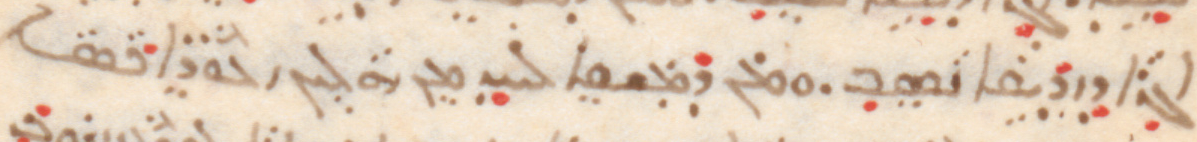ܐܓܪܐ ܕܙܕܝܩܐ ܢܣܒ. ܘܡ̇ܢ ܕܡܫܩܐ ܠܚܕ ܡ̣ܢ ܗܠܝܢ ܙܥܘܪ̈ܐ ܟܣܐ
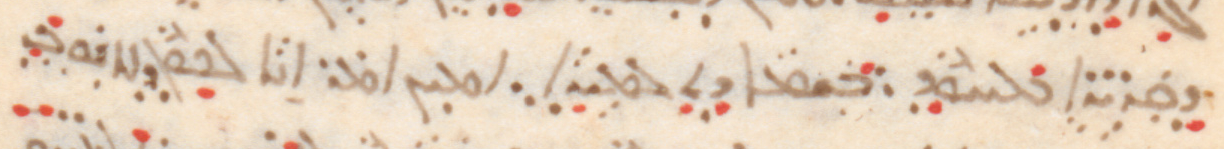ܕܩܪ̈ܝܪܐ ܒܠܚܘܕ܆ ܒܫܡܐ ܕܬܠܡܝܕܐ܆ ܐܡܝܢ ܐܡ̇ܪ ܐܢܐ ܠܟܘܢ ܕܠܐ ܢܘܒܕ
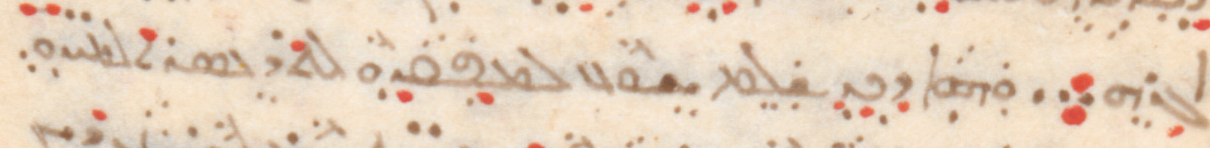ܐܓܪܗ܀ . ܘܗܘܐ ܕܟܕ ܫܠܡ ܝܫܘܥ ܠܡܦܩܕܘ ܠܬܪܥܣܪ ܬ܏ܠܡܝܕܘ
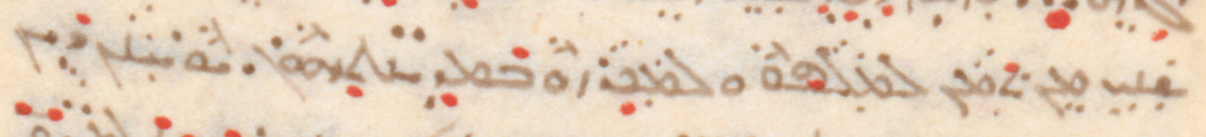ܫܢܝ ܡ̣ܢ ܬܡܢ ܠܡܠܦܘ ܘܠܡܟܪܙ ܘܒܡܕ ܝܢ̈ܬܗܘܢ. ܝܘܚܢܢ ܕܝܢ
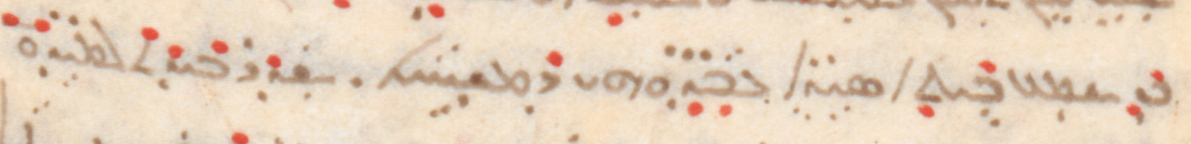ܟܕ ܫܡܥ ܒܝܬ ܐܣܝܪ̈ܐ ܥܒܕܘ̈ܗܝ ܕܡܫܝܚܐ. ܫܕܪ ܒܝܕ ܏ܬܠܡܝܕܘ
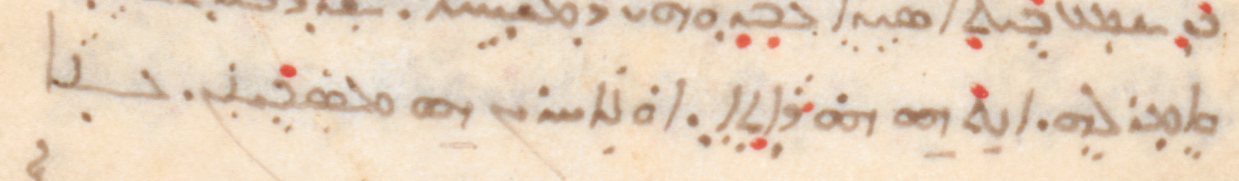ܘܐܡ̣ܪ ܠܗ. ܐܢܬ ܗܘ ܗ̇ܘ ܕܐܬ̣ܐ: ܐܘ ܠܐܚܪܝܢ ܗܘ ܡܣܟܝܢܢ. ܥܢܐ
